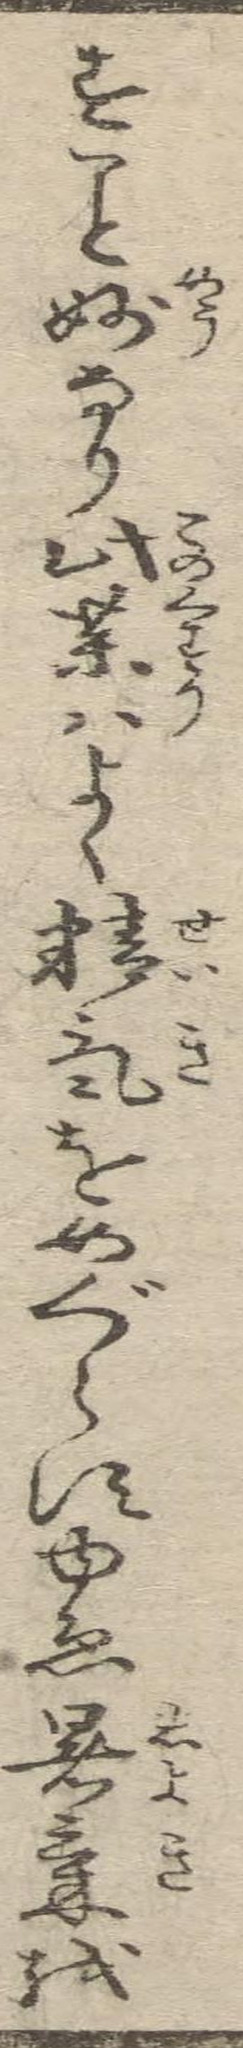すこと妙なり此薬はよく精気をめぐらすゆゑ暑気を
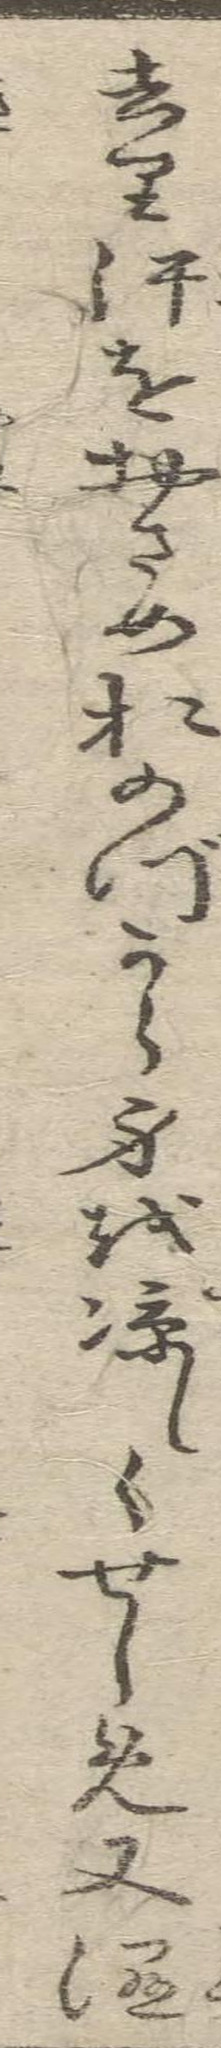去り汗をおさめおのづから身を涼しくせしめ又湿
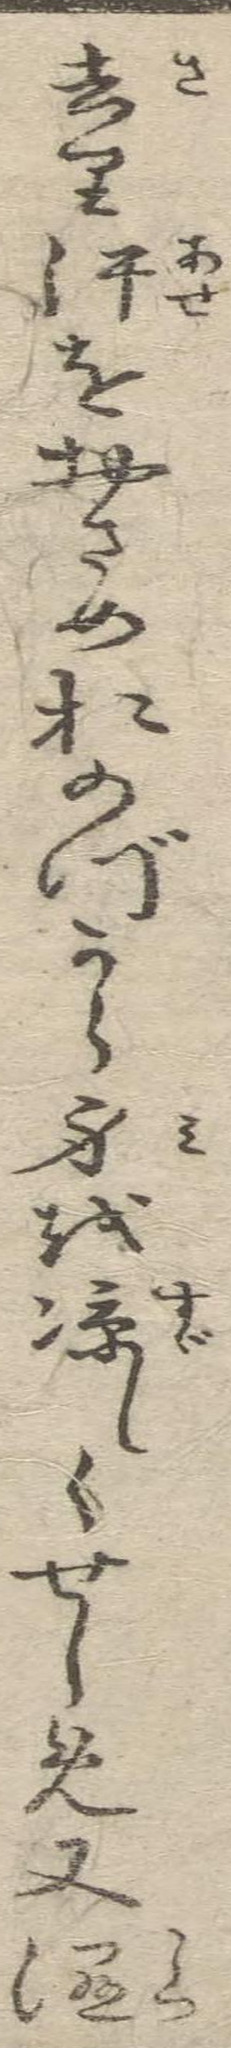去り汗をおさめおのづから身を涼しくせしめ又湿
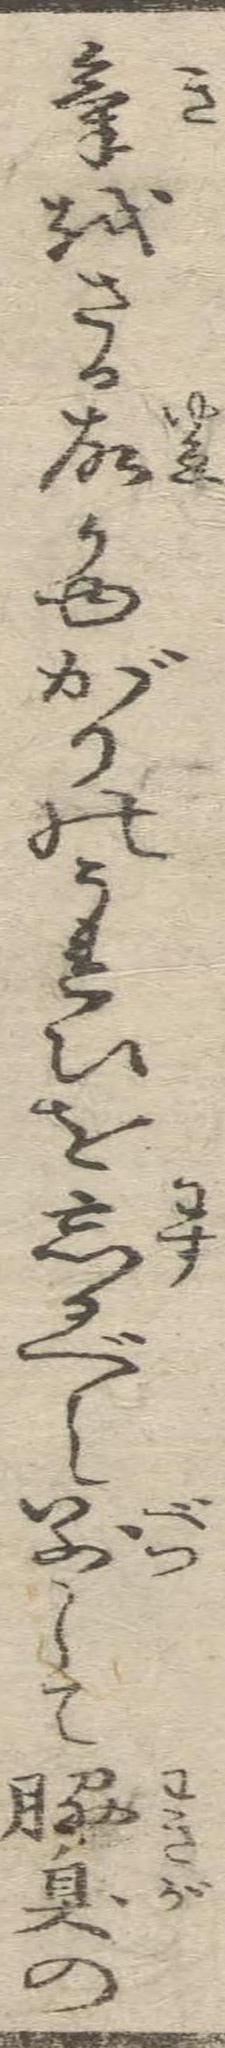気をさる故かゆがりのうれひを忘るべし別して脇臭の
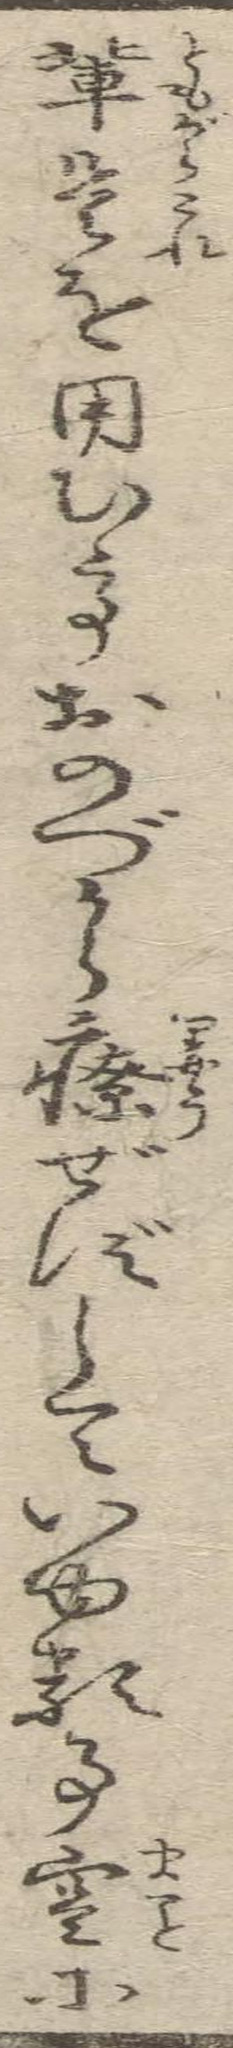輩是を用ひておのづから療ぜずしていゆる事寔に
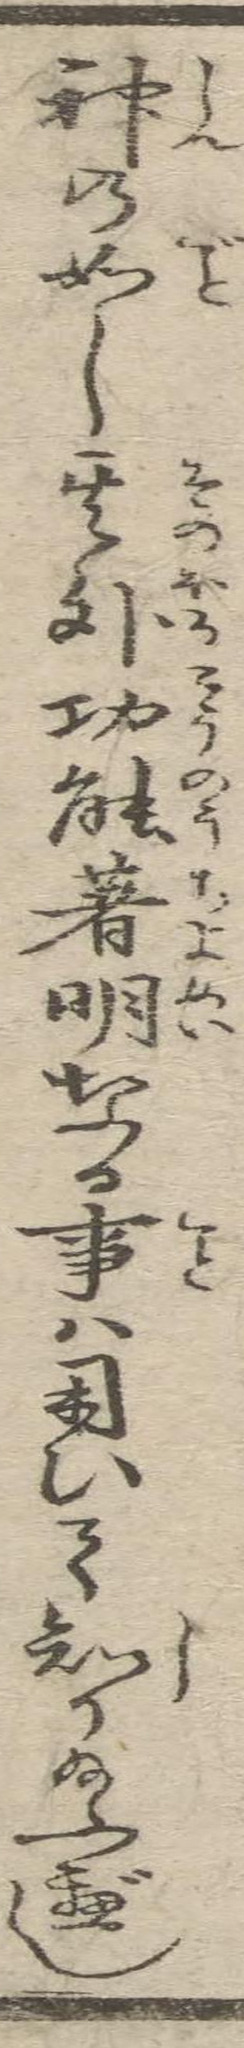神の如し其外功能著明なる事は用いて知り給ふべし

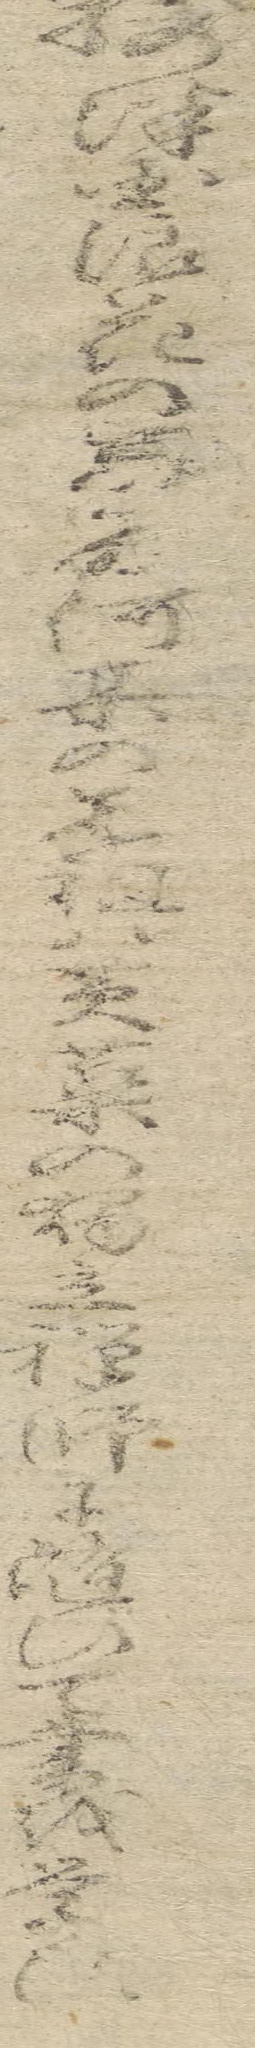摂津の国浪花の何某の先祖は黄檗の独立禅師に随ひて書を学び
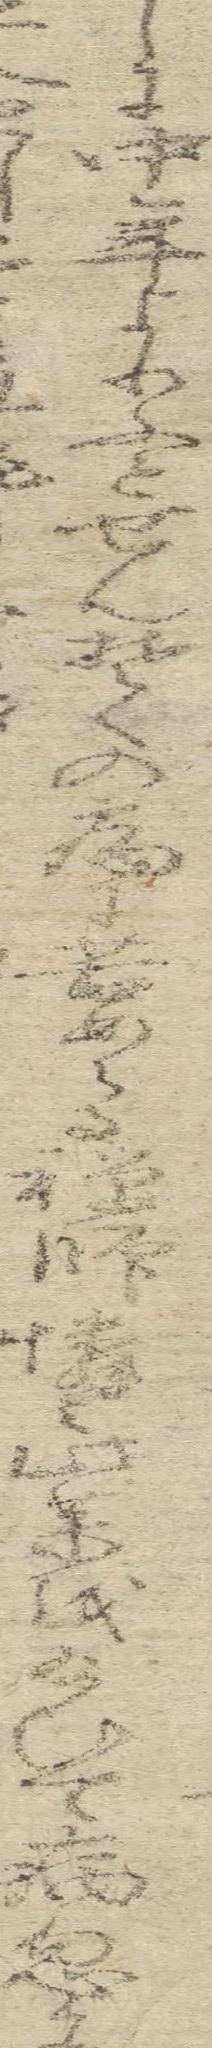しに中年よりふとせんそくの病に苦めらる禅師憐み此薬を給ひて病忽に
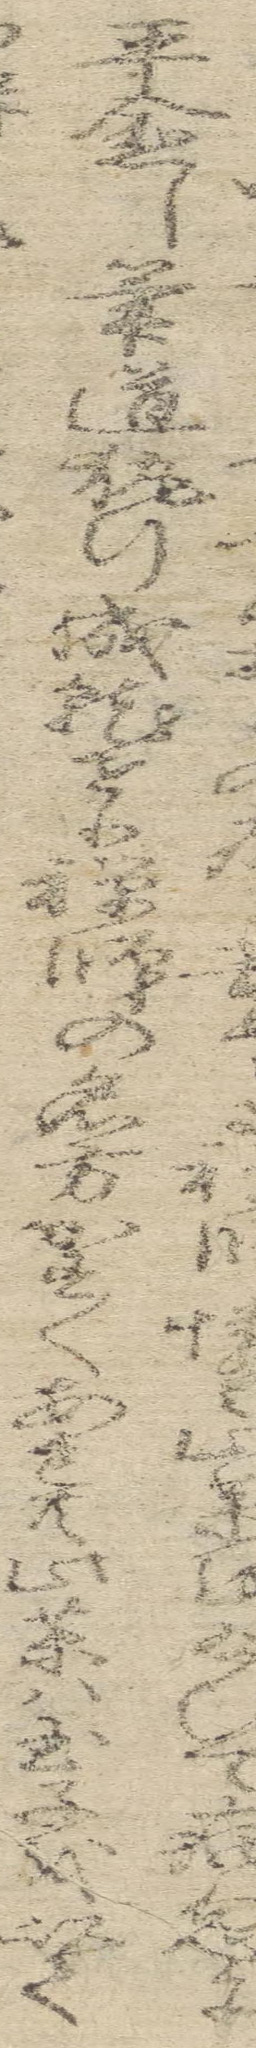平愈し筆道執行成就せり禅師の名方かす〳〵あれ共此薬は玉子を以て
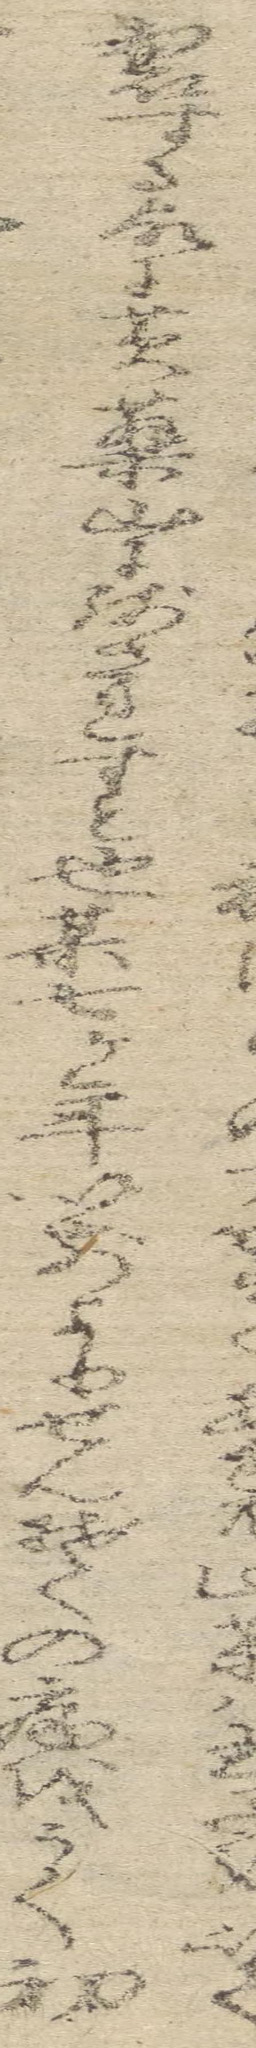製する故に黄檗山に残されすと也某七ケ年以前よりせんその病をうく初
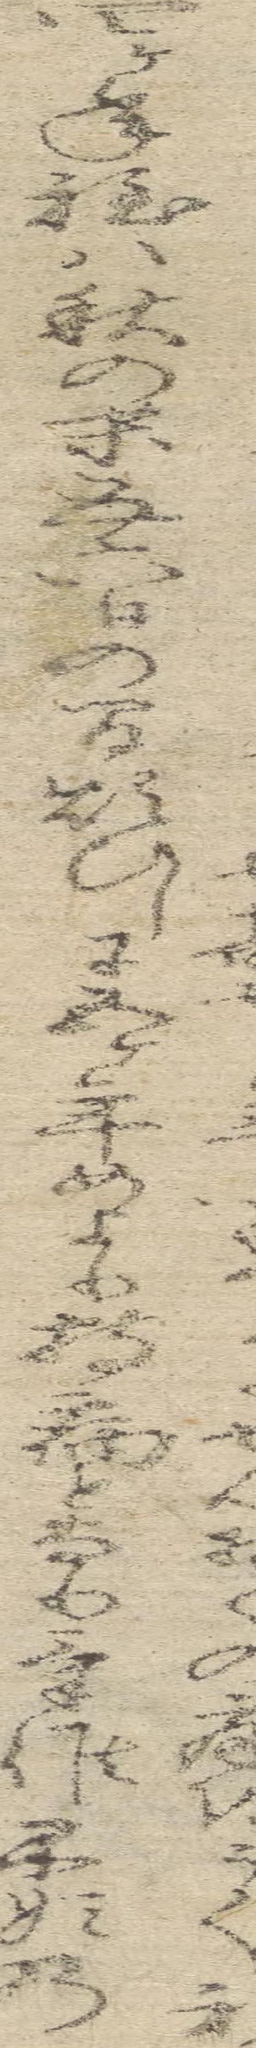四ヶ年程は秋の末五六日の間煩ひしに五ケ年めより持病となり気候不順の
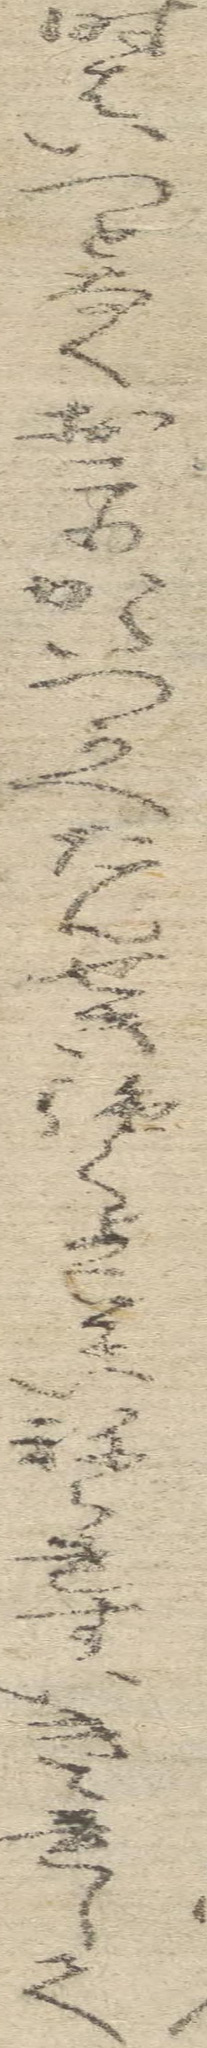時はいつとなくおこりかたつかへたんせき強くよこにいねられずいきゝれして
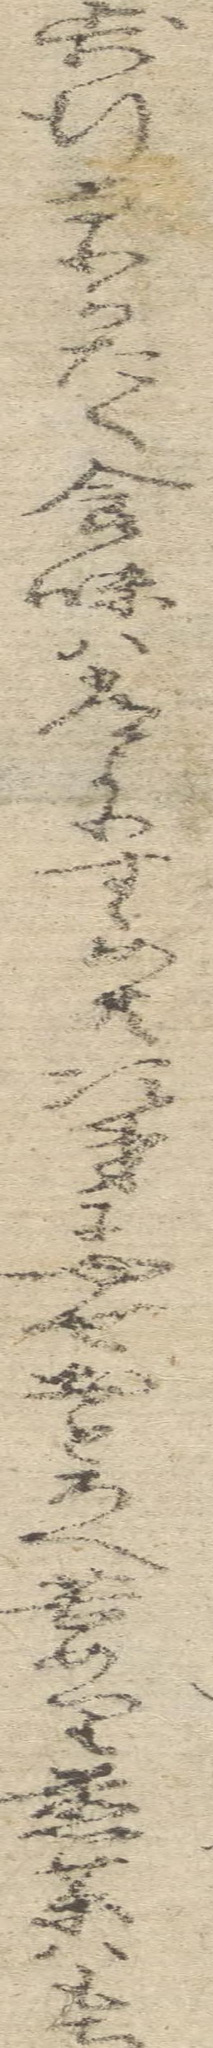歩行なりかたく食味は常よりすゝめ共次第にやせおとろへ苦めり煎薬はもち
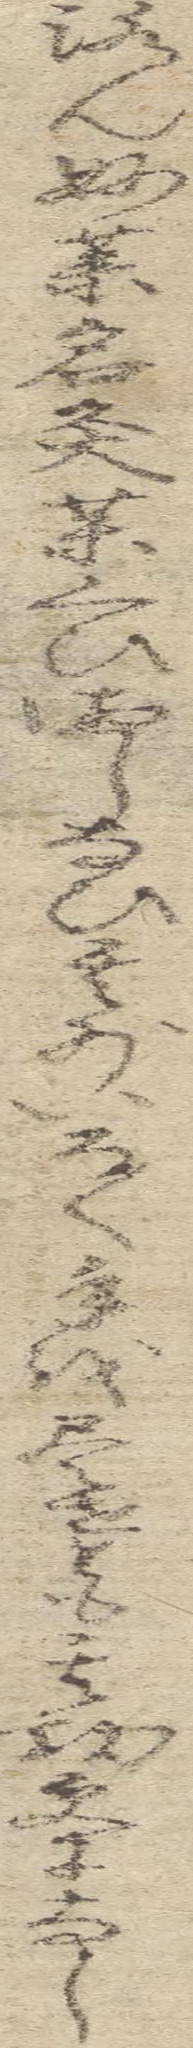ろん妙薬名灸薬くひましなひ其外いろ〳〵手を尽せとも其功更になし
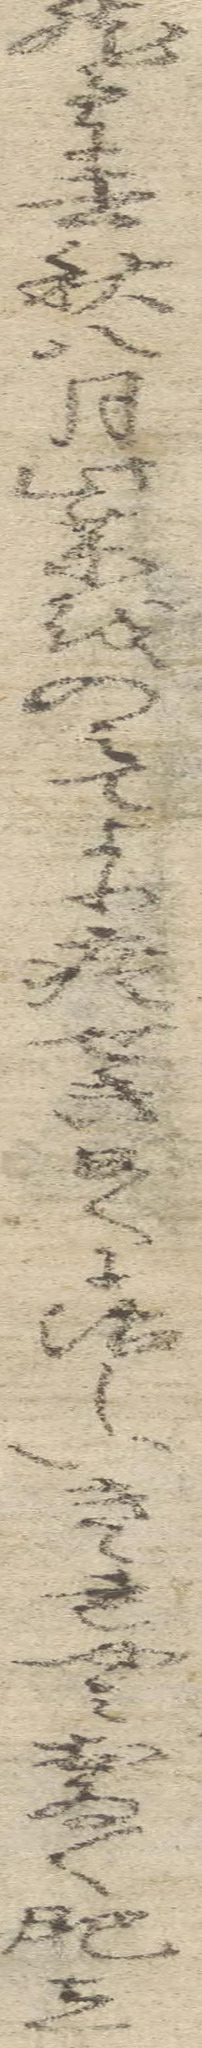然るに去秋八月此薬をのみてより痰せき日々に治しいきゝれやみおゐ〳〵肥立
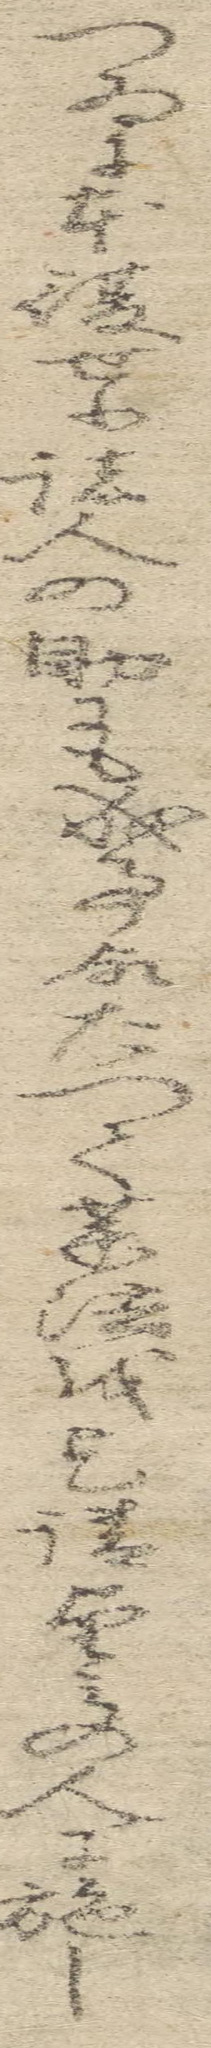つゐに本復せり諸人の助にも成事故たつて薬法を乞請望みの人に施し
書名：浪華薬種問屋能書張交帖. 二
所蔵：国立国会図書館 National Diet Library, JAPAN
